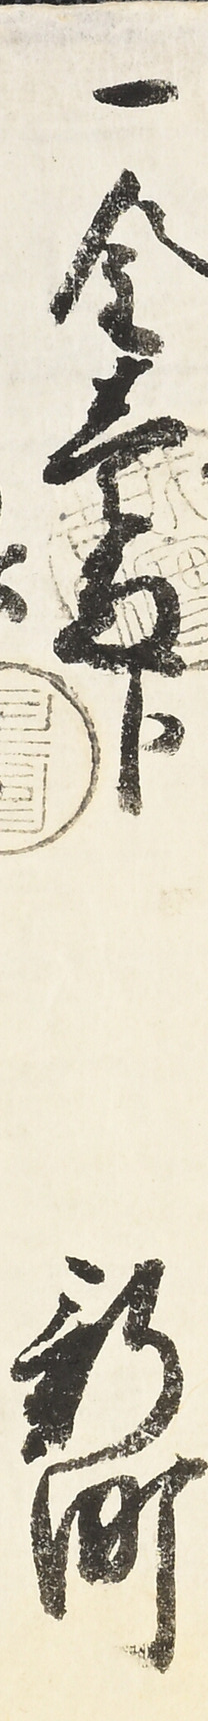一金壱両ト新町
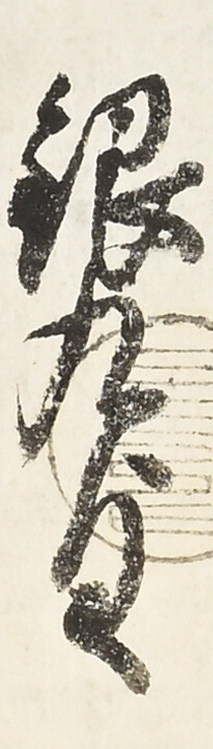銀九匁
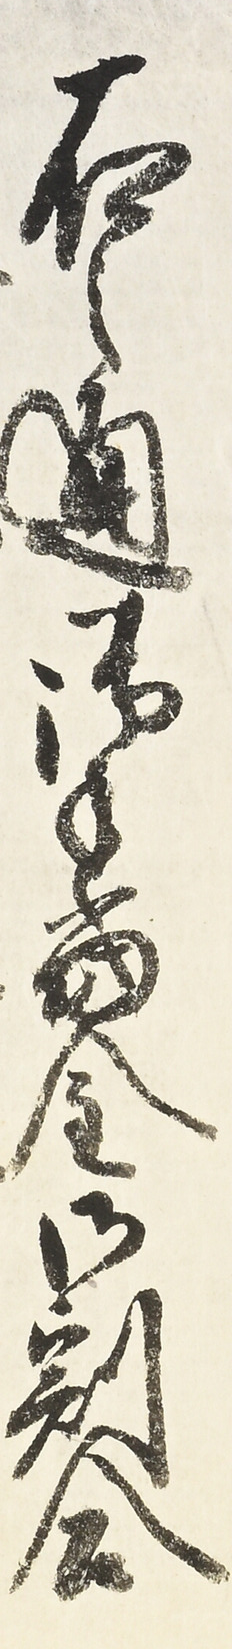右之通御手当金御割合
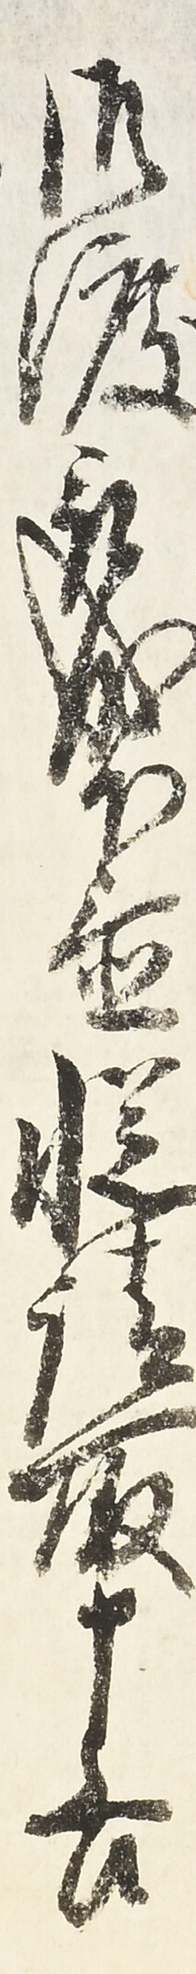御渡被成下置慥請取申上候
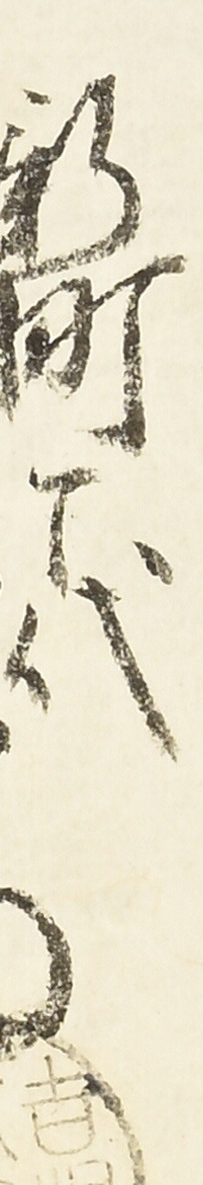新町丁代
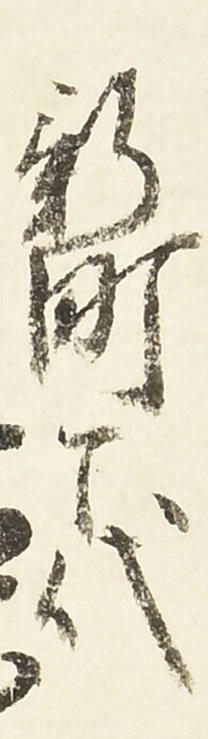新町丁代
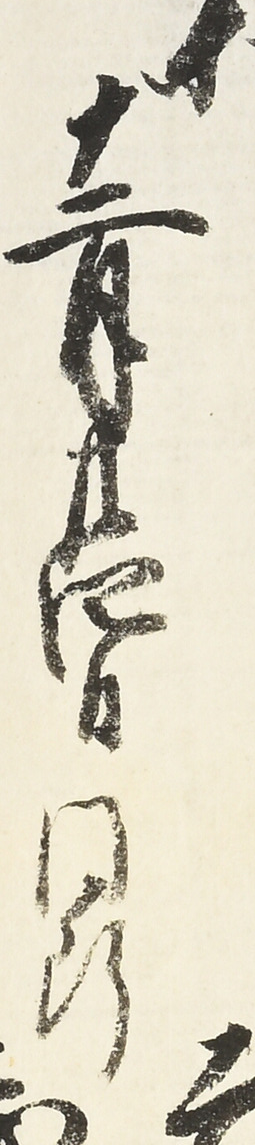十二月廿四日同断
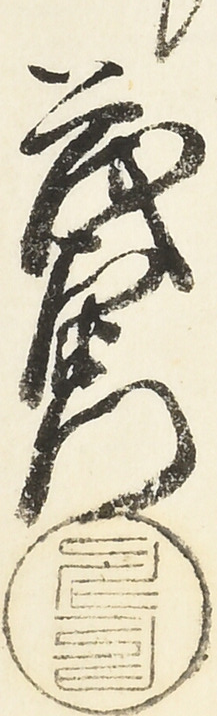茂右衛門
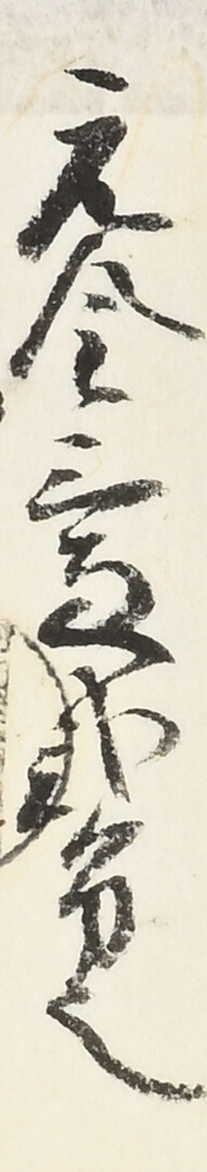元金三両弐分也
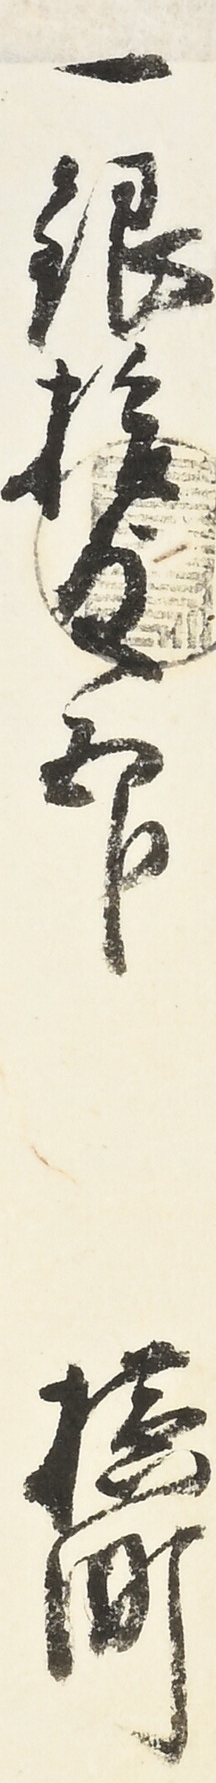一銀拾匁五分横町
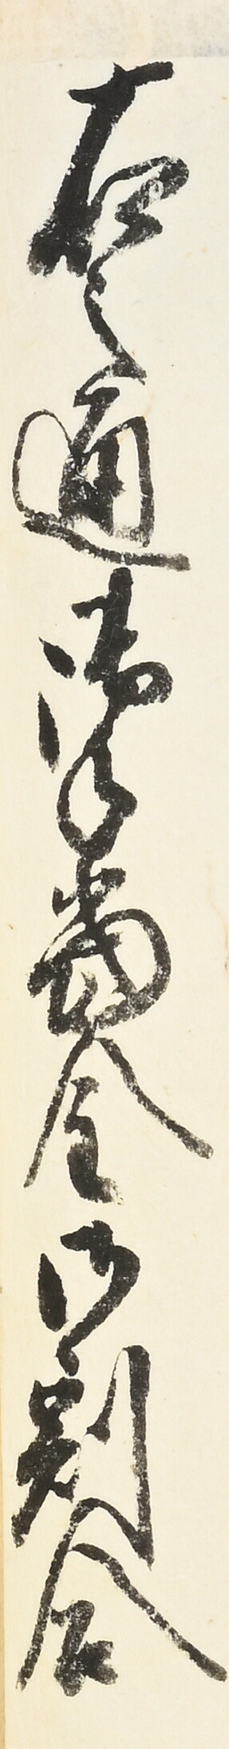右之通御手当金御割合
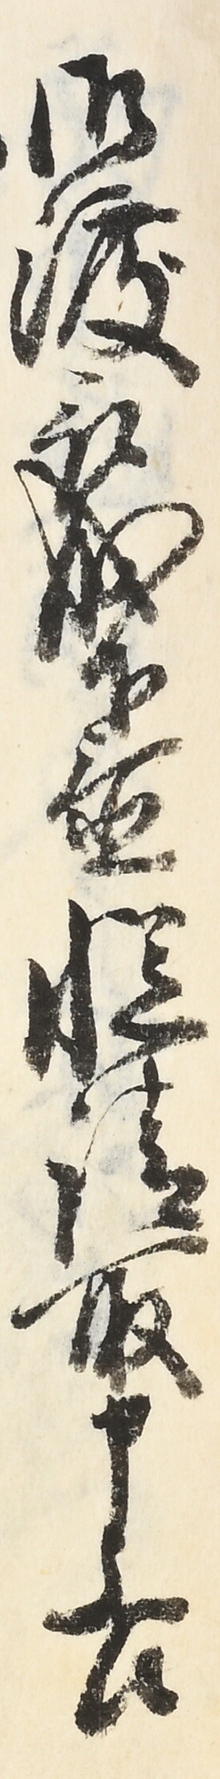御渡被成下置慥請取申上候
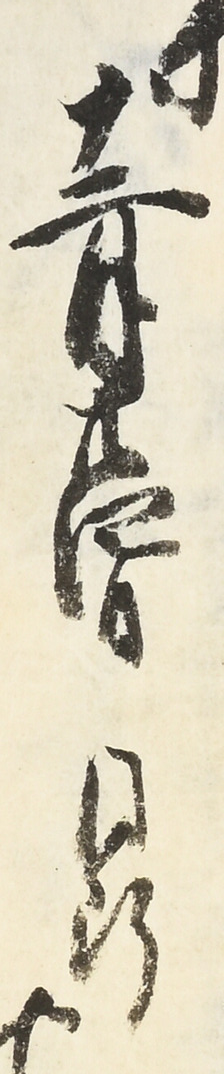十二月廿四日同断

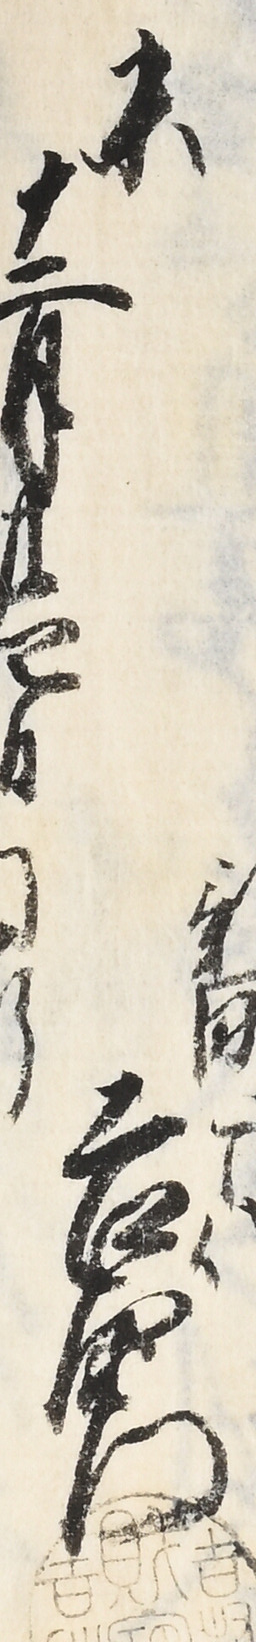十二月廿四日同断
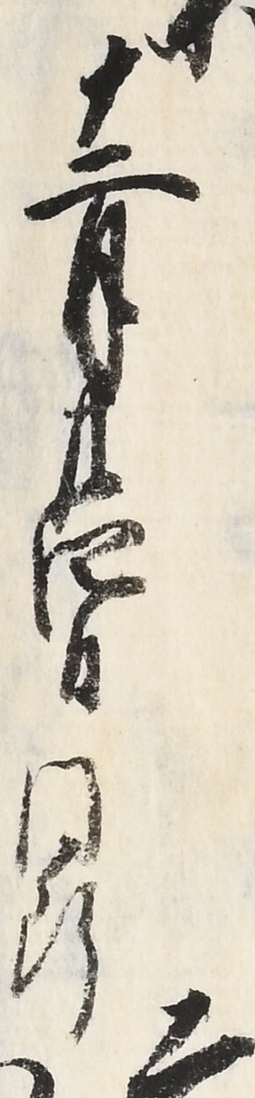十二月廿四日同断
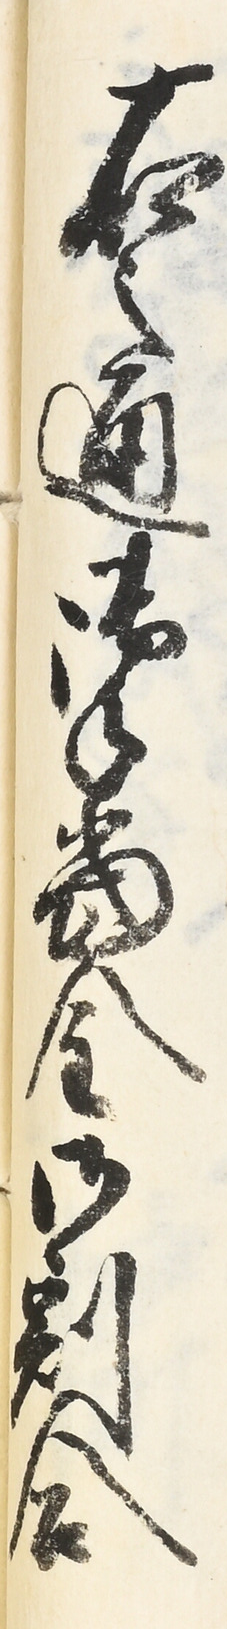右之通御手当金御割合
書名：御才覚金御利足割渡扣帳
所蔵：伊那市立高遠町図書館・合同会社AMANE
